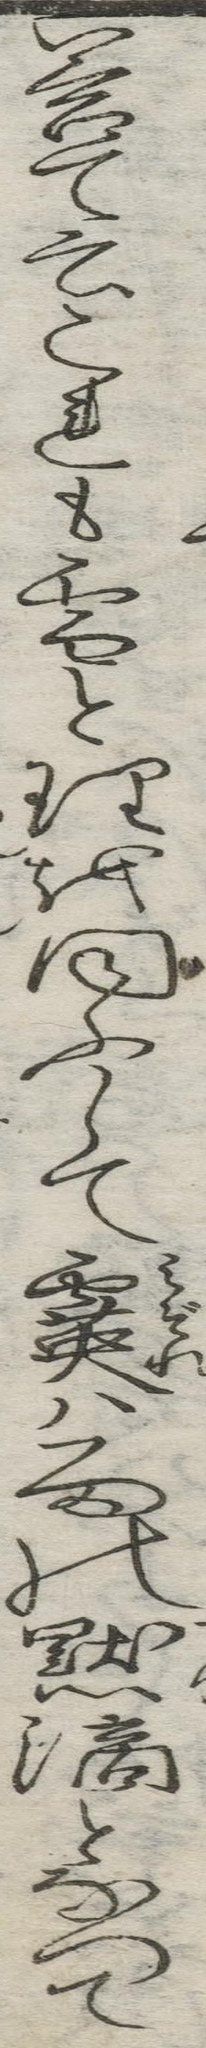答て云これも雪と理を同ふして霙は雨の黙滴となつて
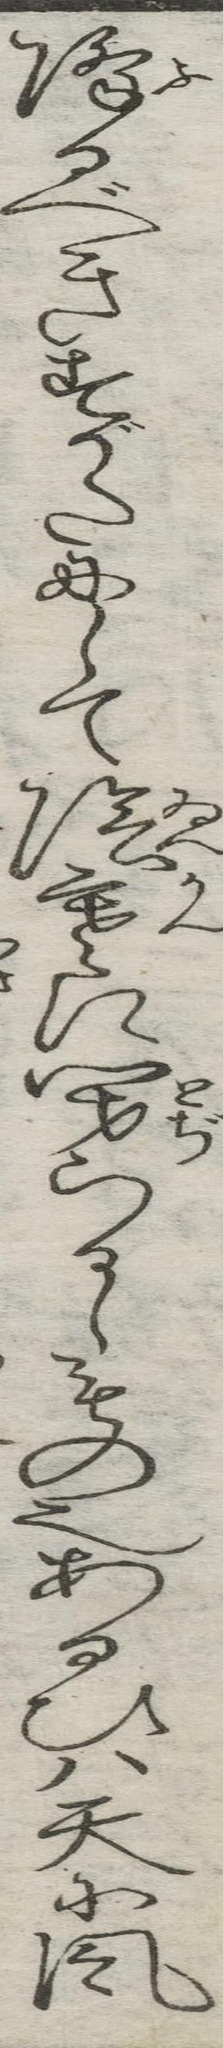降るべきすがたにして陰寒に閉らるゝもの也あるひは天に風
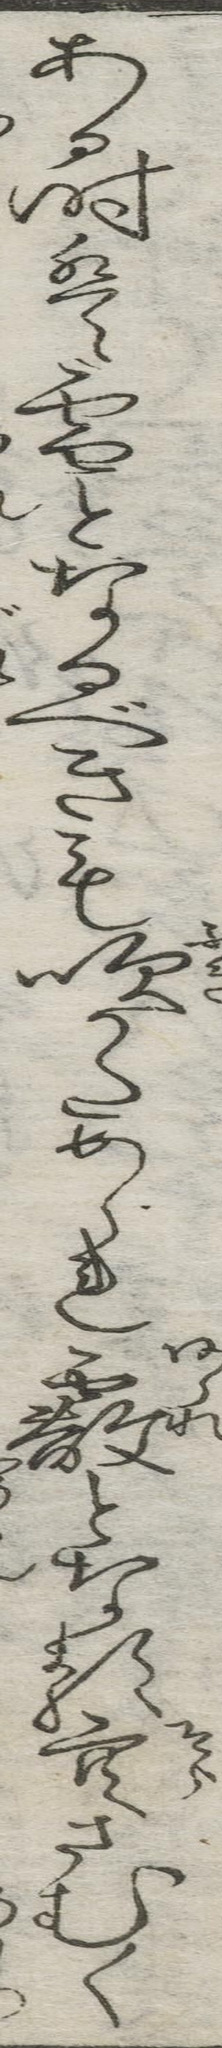ある時にて雪となるべきも吹かためられ霰となりそさむく
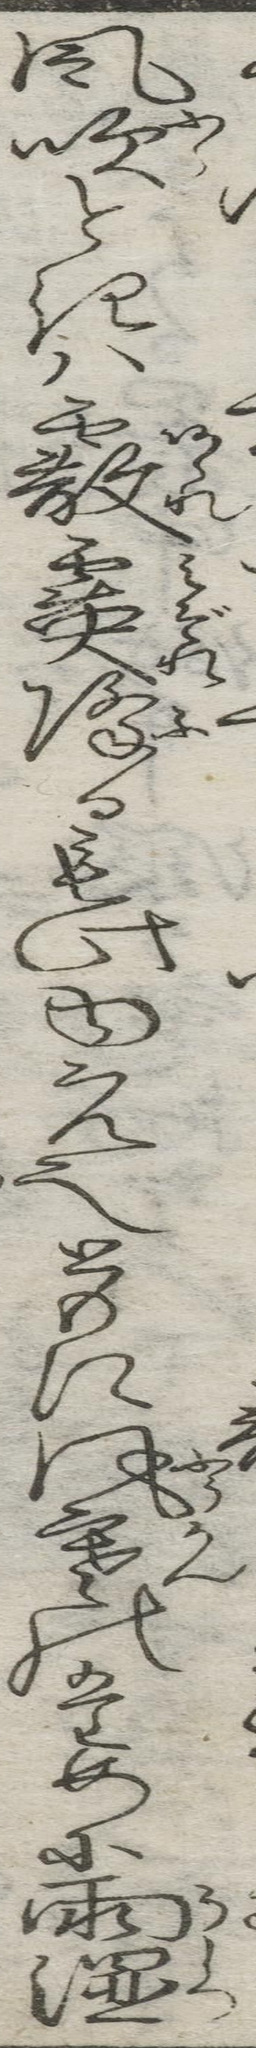風吹ときは霰霙降るも此ゆえ也ともに風寒のために雨湿
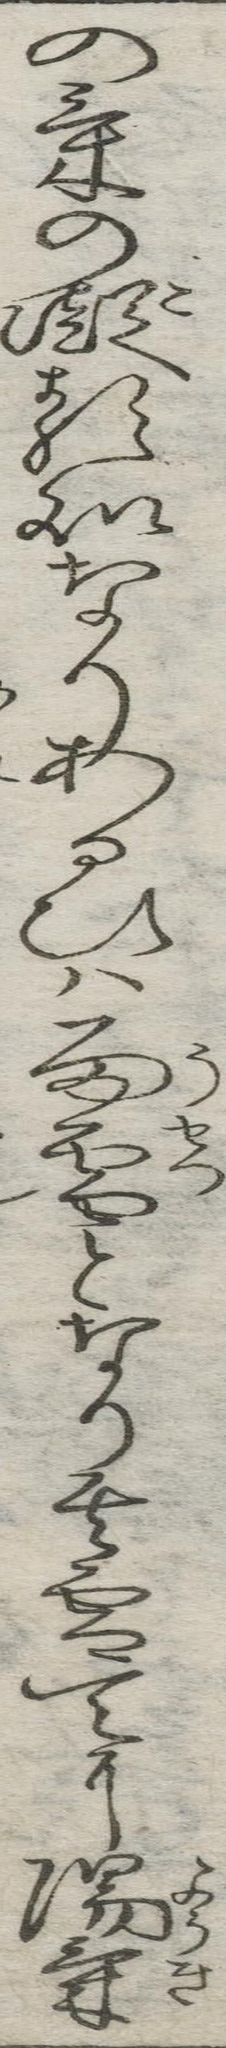の気の凝る処なりあるひは雨雪となり其雪天に陽気
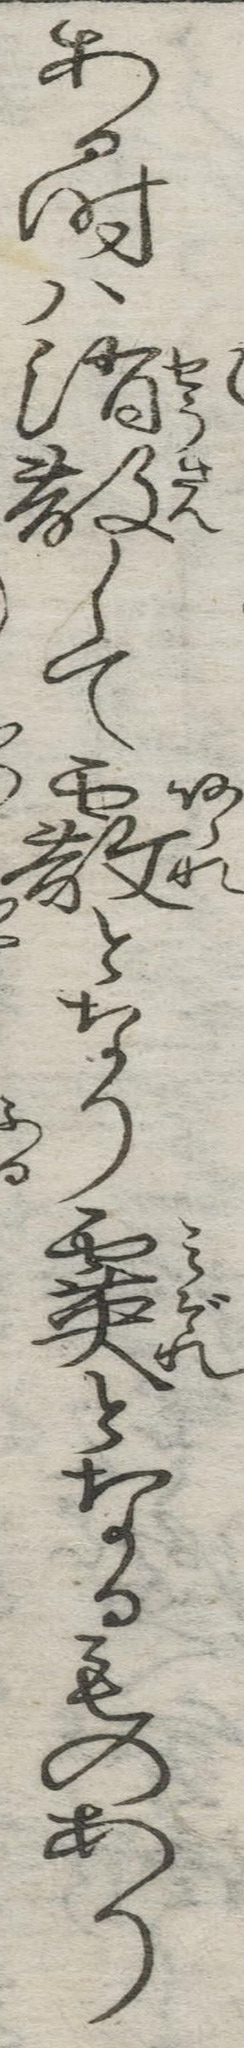ある時は消散して霰となり霙となるものあり
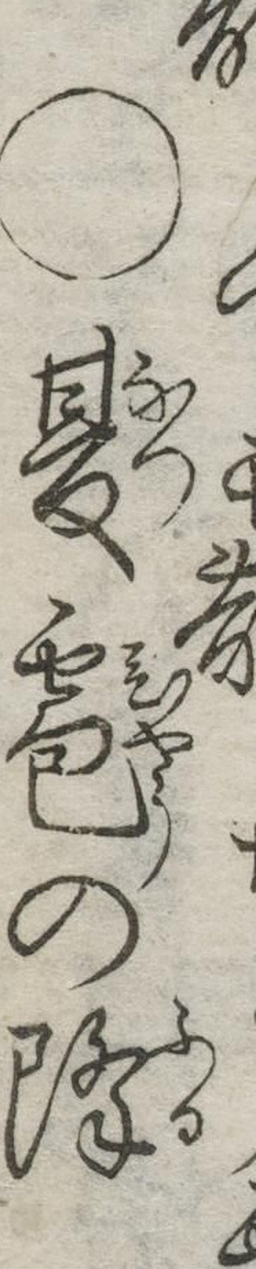〇夏雹の降
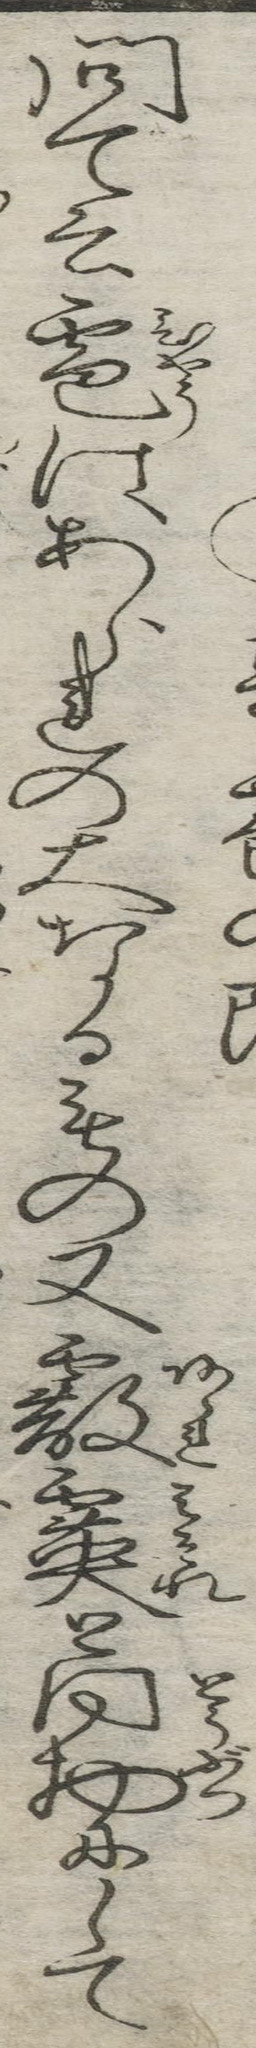問て云雹はあられの大なるもの又霰霙と同物にして
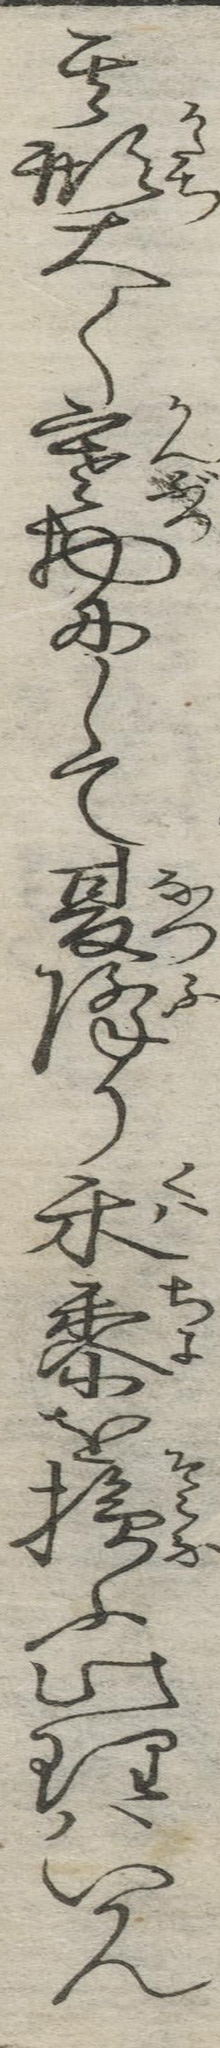其形大く寒物にして夏降り禾黍を損ふ此理はいかん

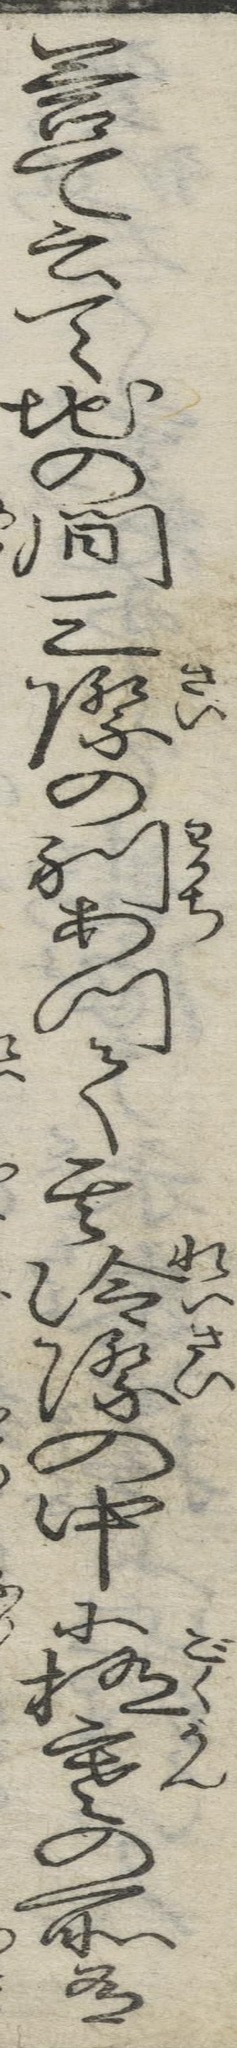答て云天地の間三際の別あつて其冷際の中に極寒の所有
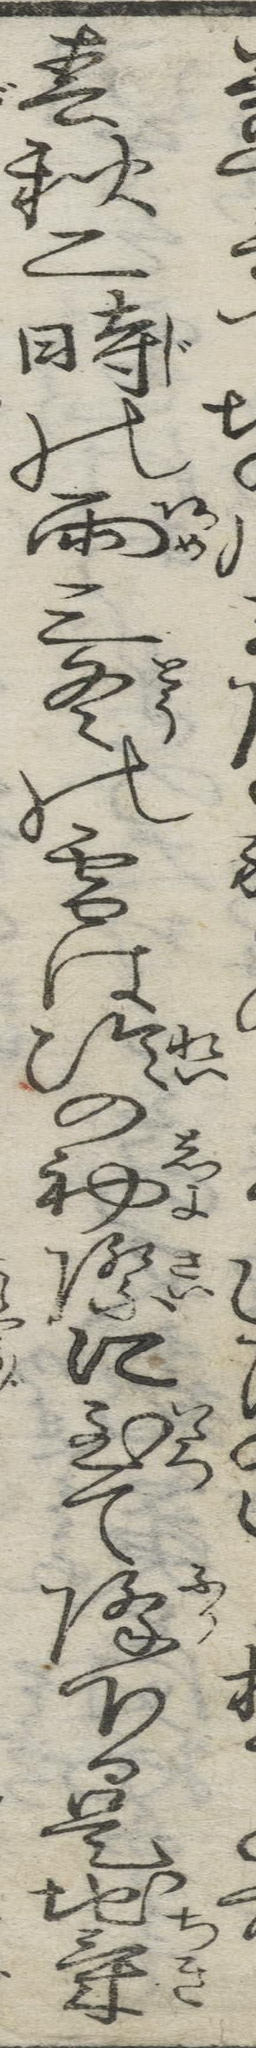秋二時の雨三冬の雪は冷の初際に至て降下る是地気
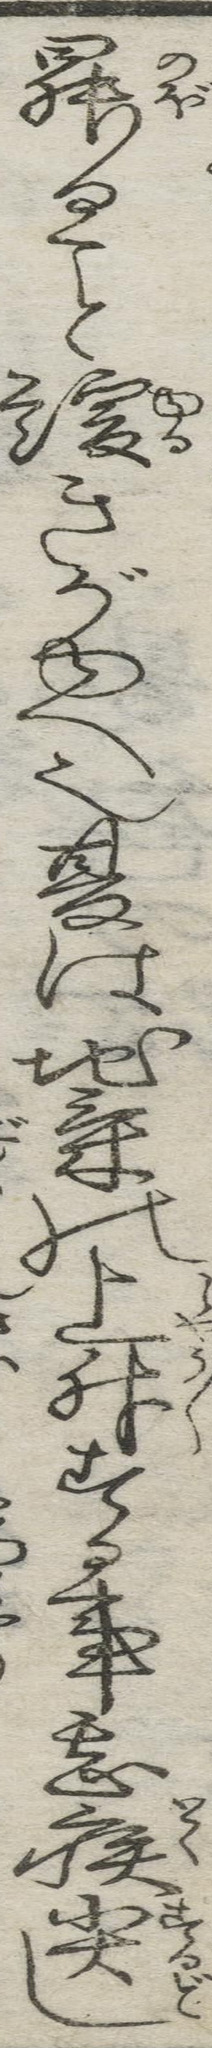昇ること緩きがゆえ也夏は地気の上昇する事甚疾尖し
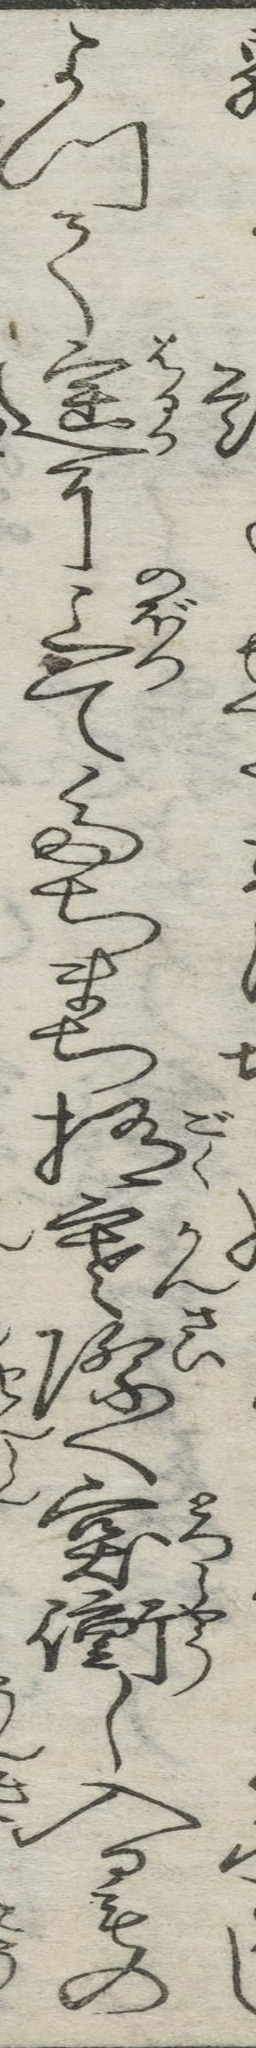よつて遥かに上てたちまち極寒際へ突衝し入るもの
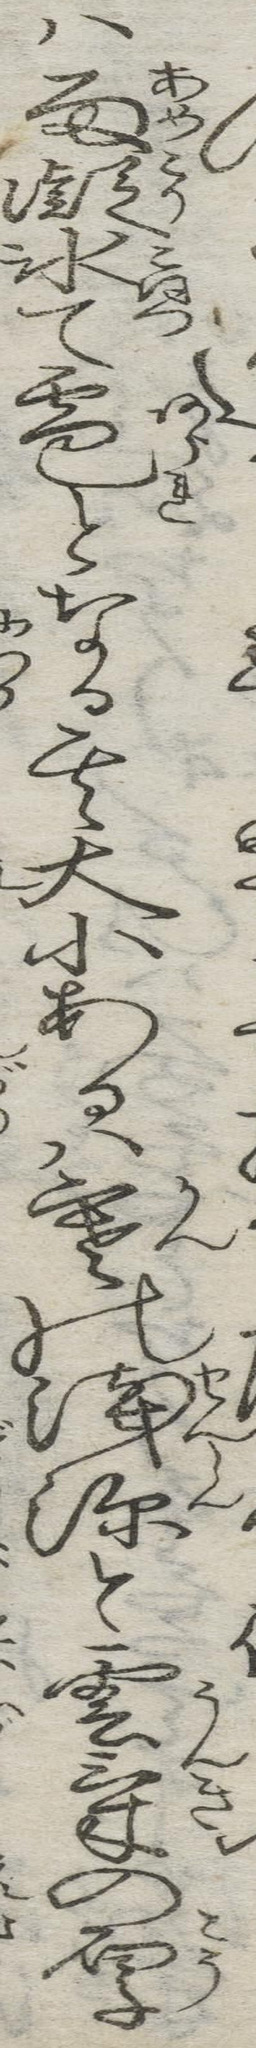は雨凝氷て雹となる其大小あるは寒の浅深と雲気の厚
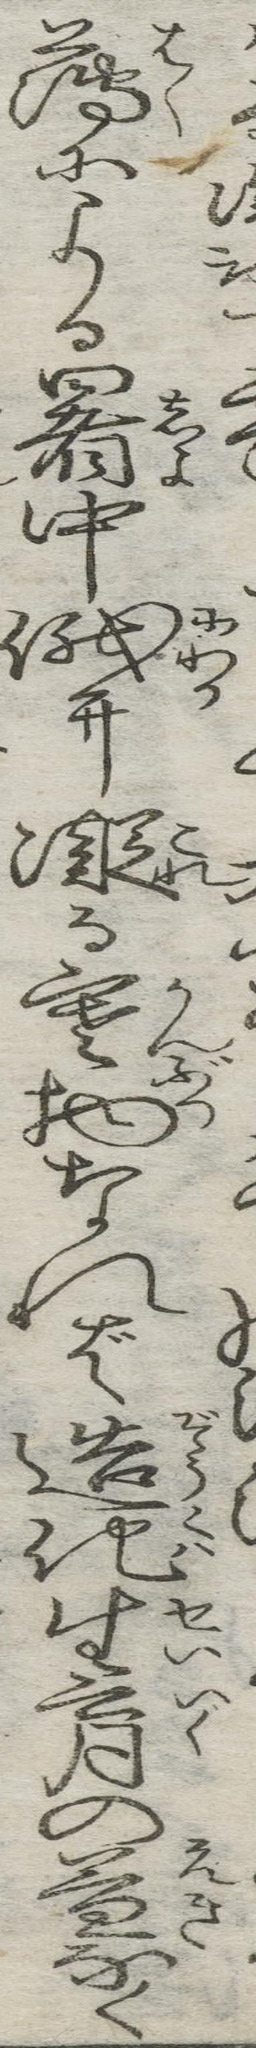薄による暑中俄に凝る寒物なれば造化生育の益なく
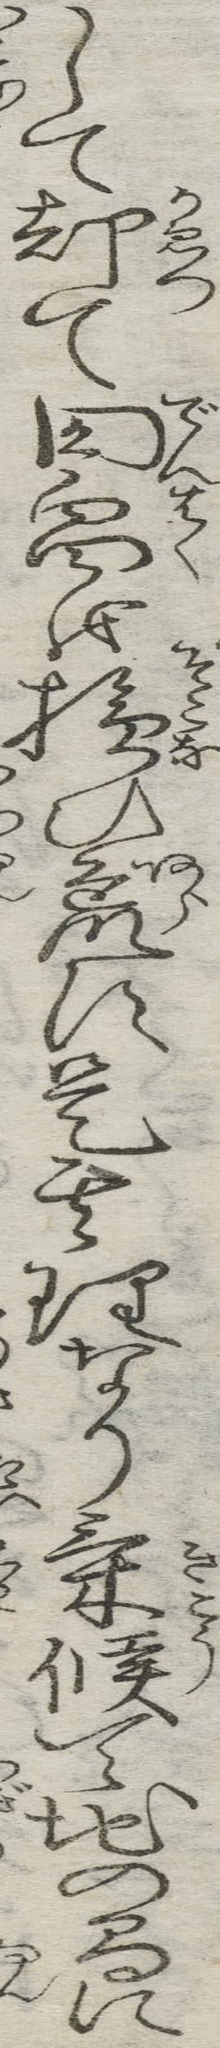して却て田畠を損ひ荒す是其理なり気候天地の間に
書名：訓蒙天地辨　地
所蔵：東京大学地震研究所図書室 Earthquake Research Institute Library, The University of Tokyo, JAPAN
